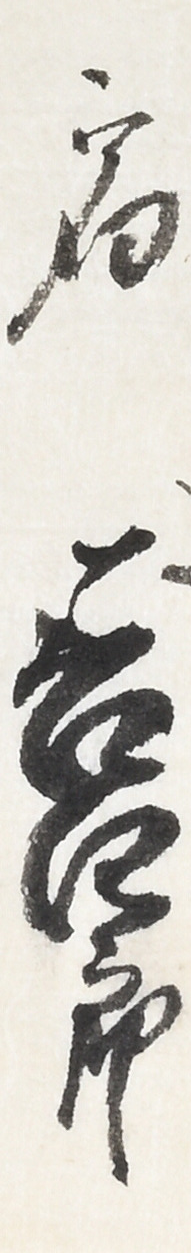宿善四郎
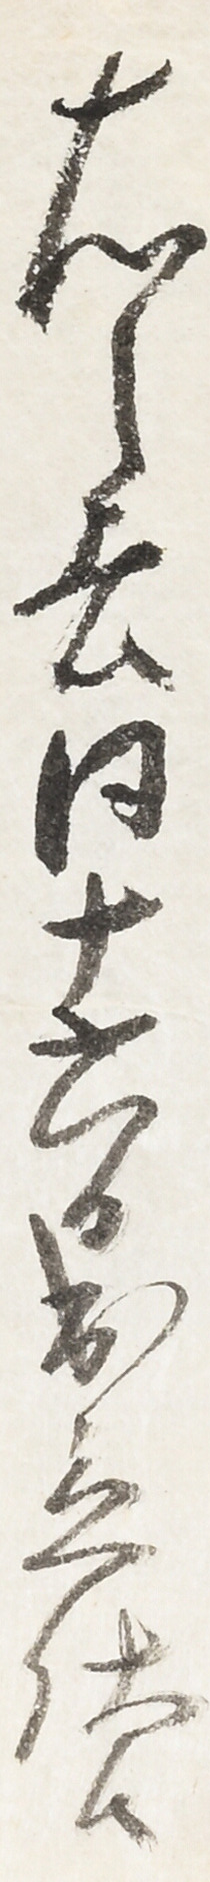右之者同十六日出立仕候
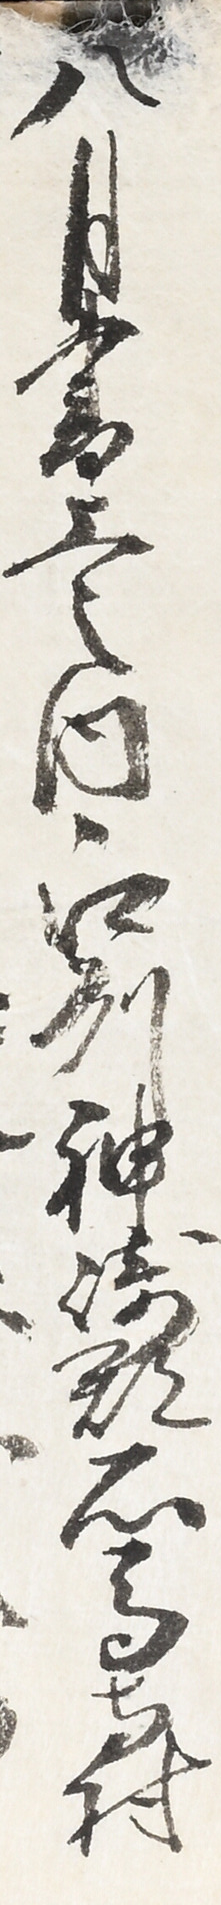八月書上之内江州神崎郡石馬寺村
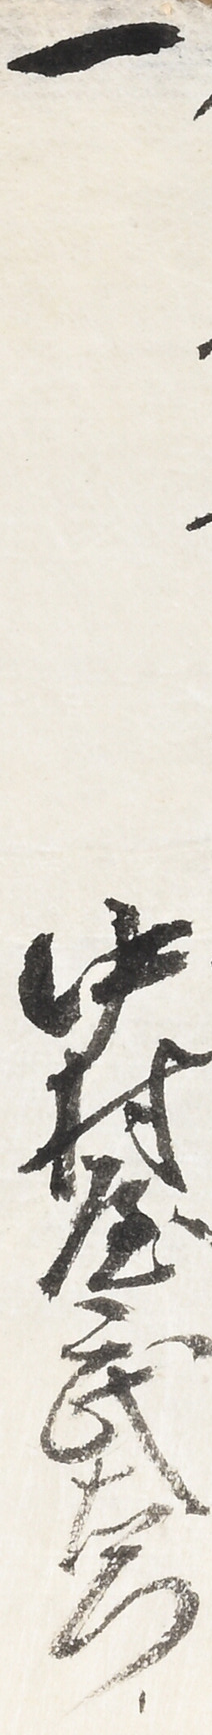一中村屋武右衛門・
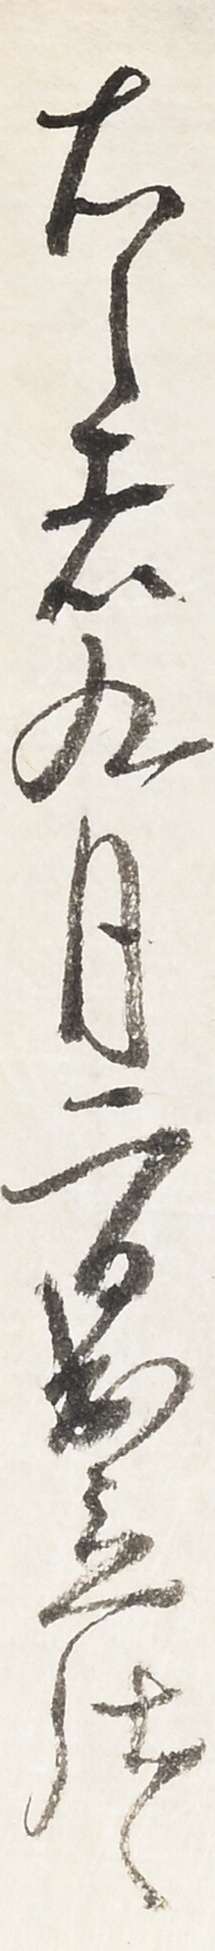右之者九月二日出立仕候
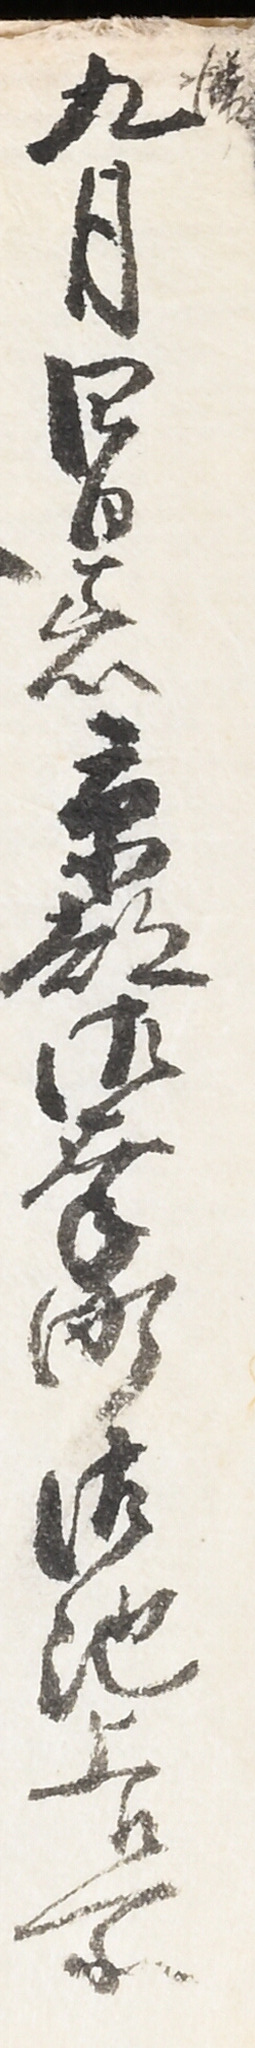九月四日着京都御幸町御池上ル所
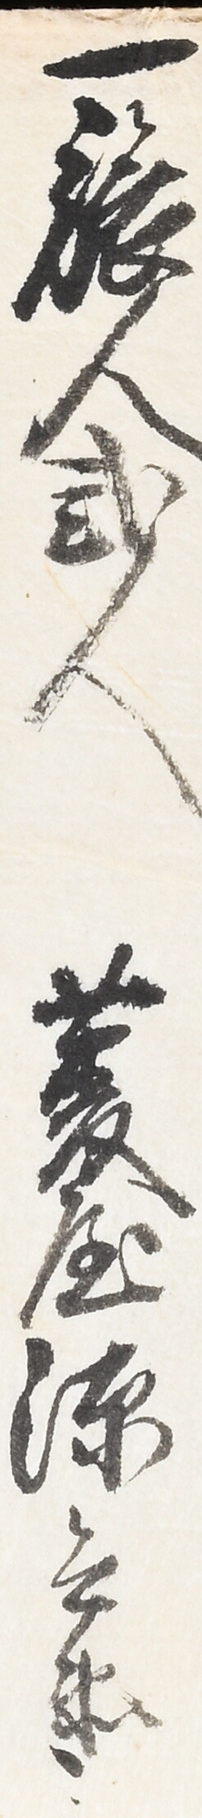一旅人弐人菱屋源兵衛・
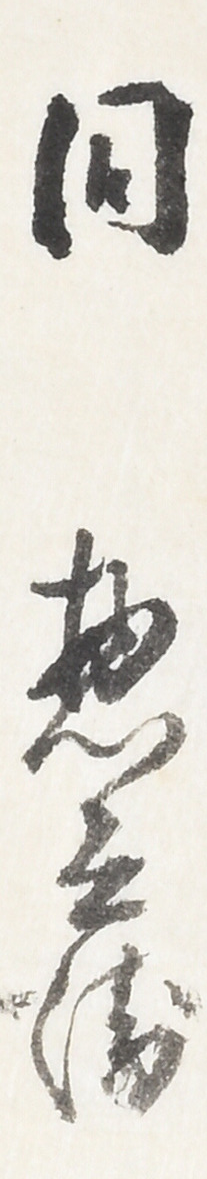同惣兵衛
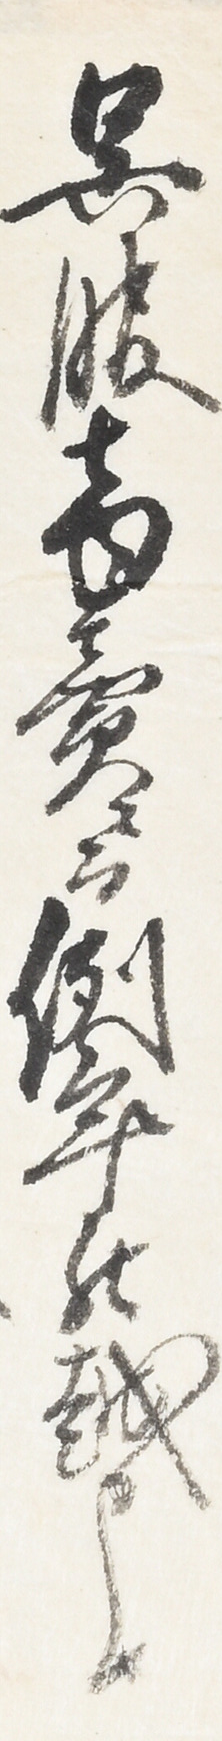呉服商売ニ而例年罷越申候
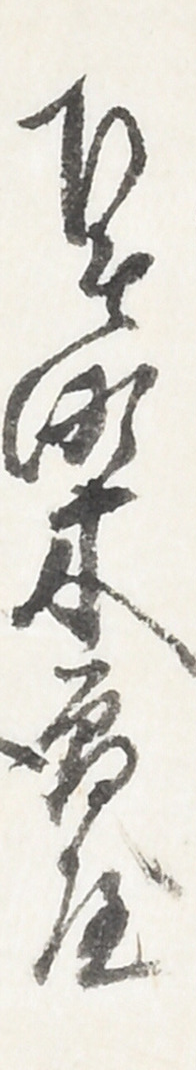下モ町木曽屋
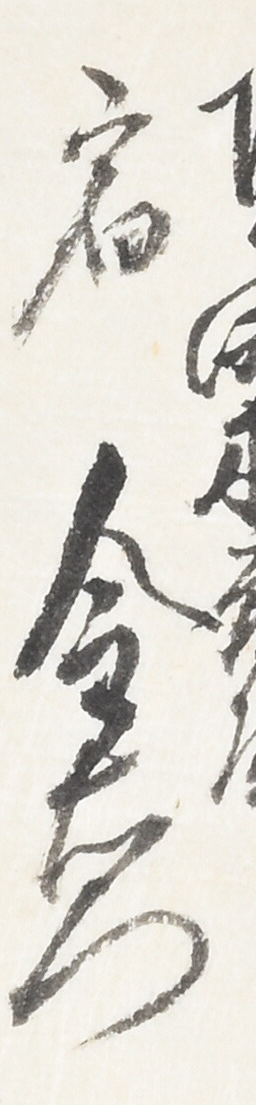宿金右衛門
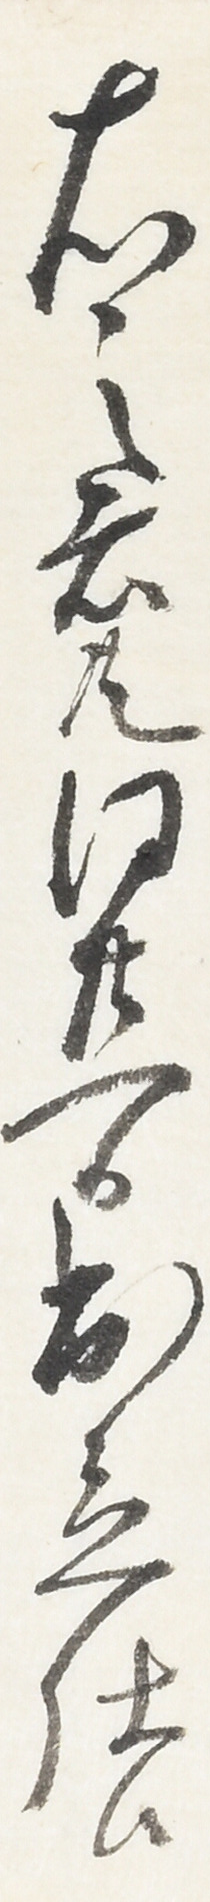右之者共同廿一日出立仕候
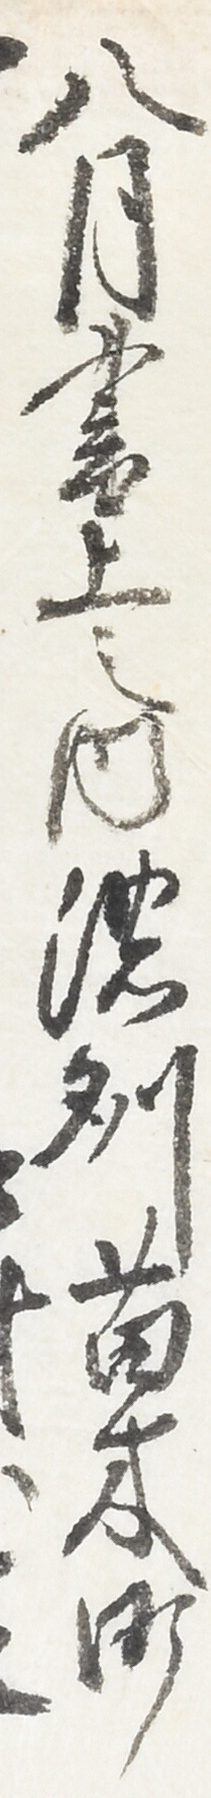八月書上之内濃州苗木町
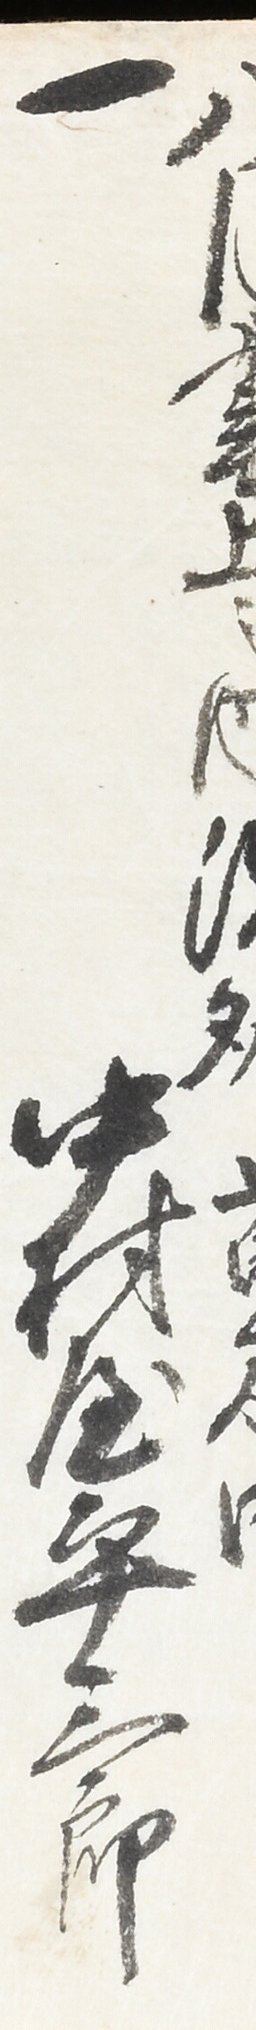一中村屋平三郎
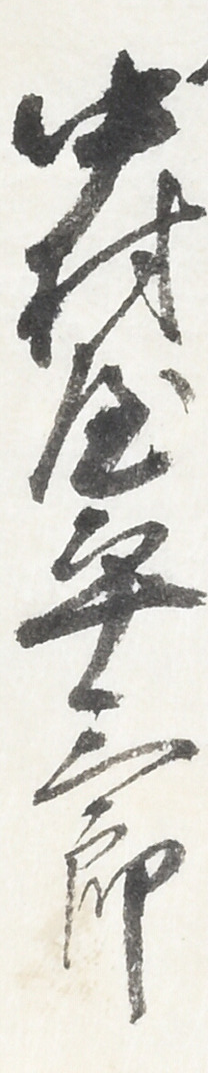一中村屋平三郎
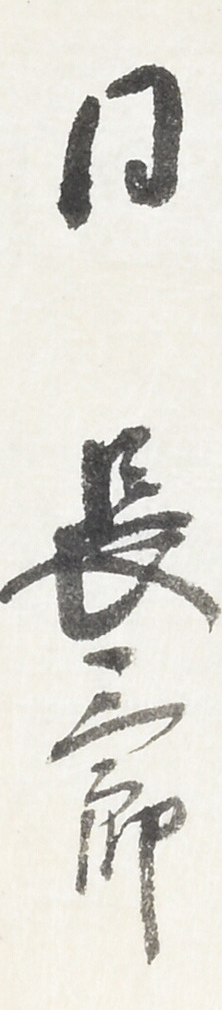同長三郎
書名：旅人泊控帳
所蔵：伊那市立高遠町図書館・合同会社AMANE
